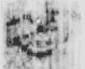亯
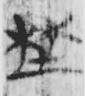野
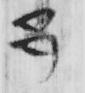邑
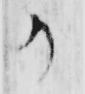人
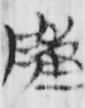○（陳）
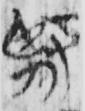○（賢）
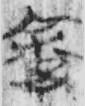舒
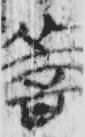善
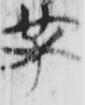某
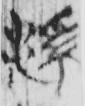溪
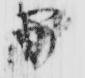邑
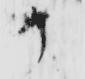人
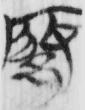殷
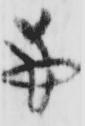志
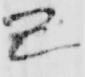己
